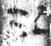之
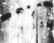五
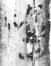檐（擔）
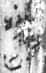○（巂）
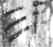三
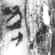敔
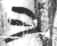之
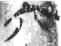六
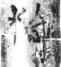檐（擔）
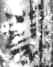○（巂）
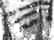三
